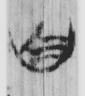自
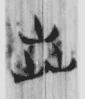芔
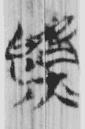{既火}
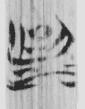渴
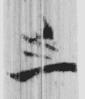之
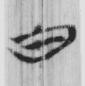日
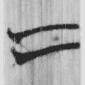二
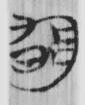旬
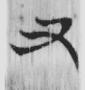又
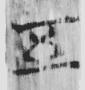五
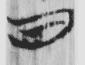日
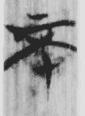不
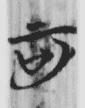可
